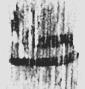亡
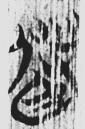○（僕）
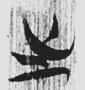之
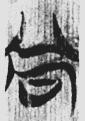尚（掌）
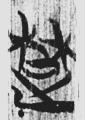楚
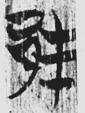邦
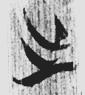之
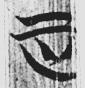正（政）
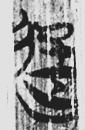○（坐）
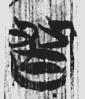○（友）
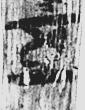五
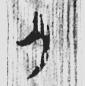人
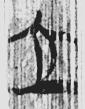立
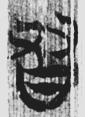○（友）
